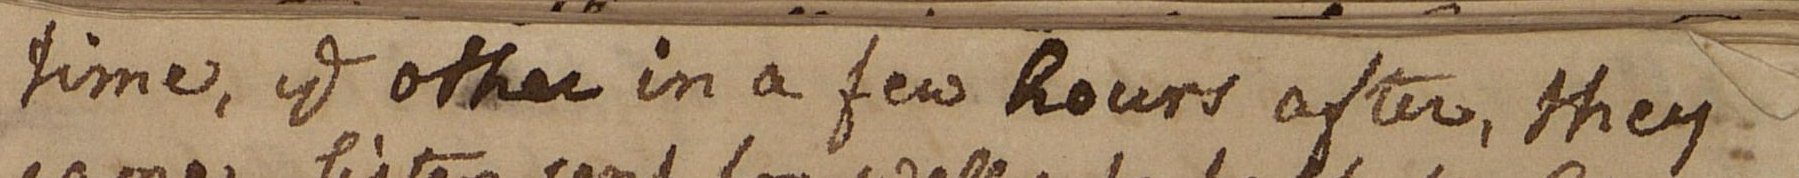time, y^e other in a few hours after, they
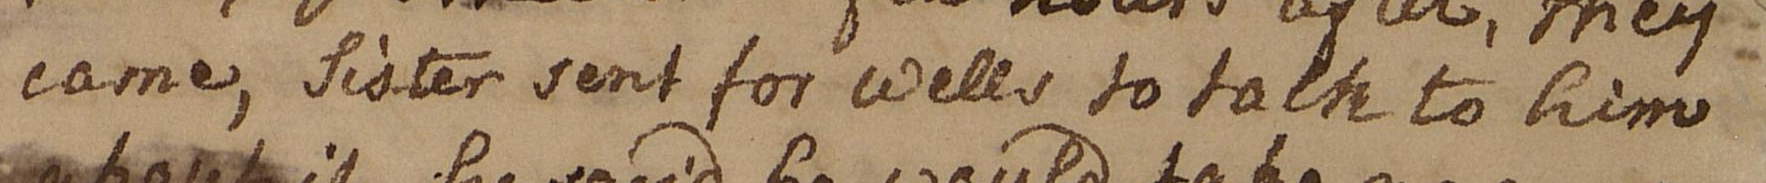came, Sister sent for wells to talk to him
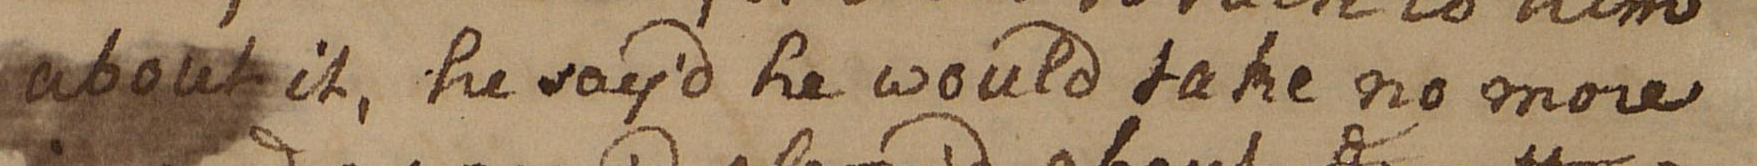about it, he say'd he would take no more
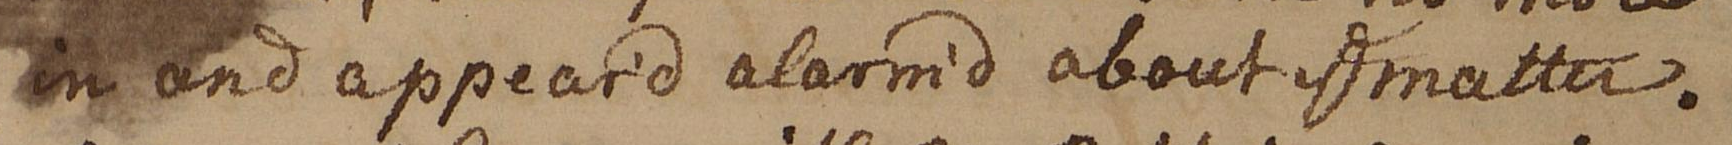in and appear'd alarm'd about y^e matter.
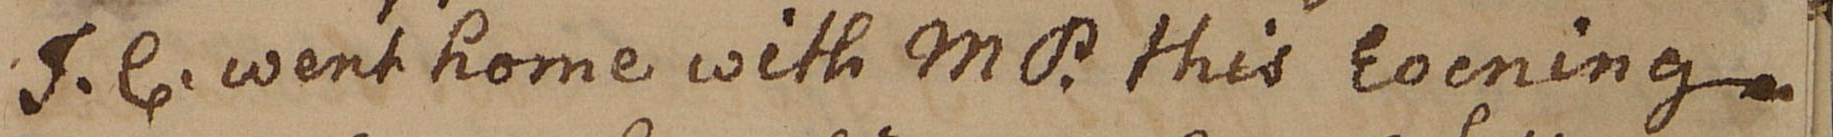J.C. went home with M P. this Evening.
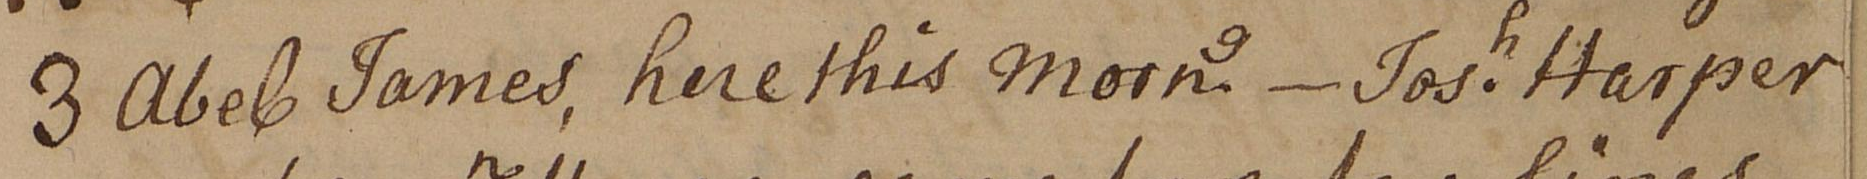3 Abel James, here this morn^g- Jos^h. Harper
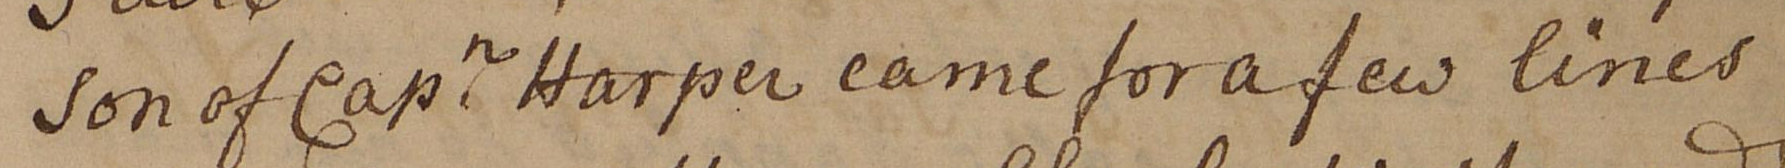Son of Cap^n. Harper came for a few lines
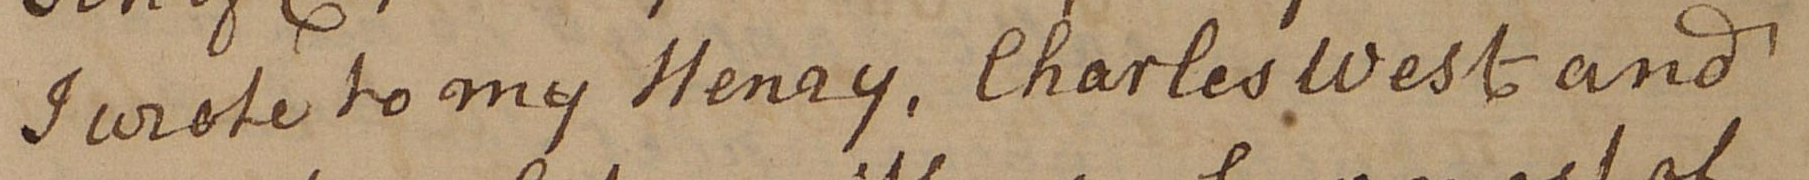I wrote to my Henry, Charles West and
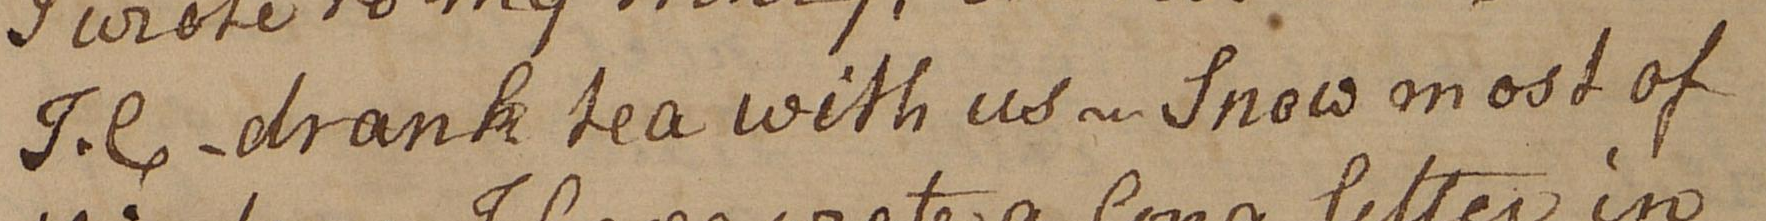J.C- drank tea with us- Snow most of
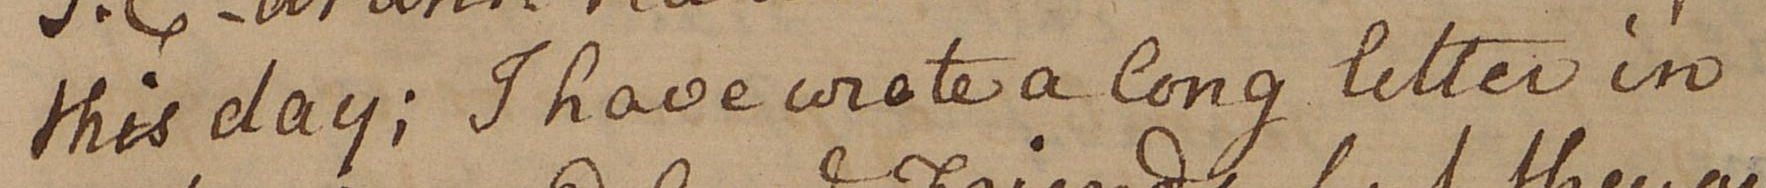this day; I have wrote a long letter in
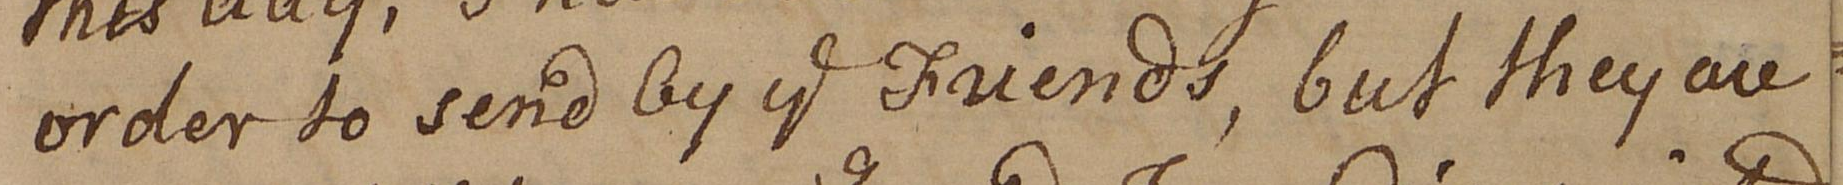order to send by y^e Friends, but they are
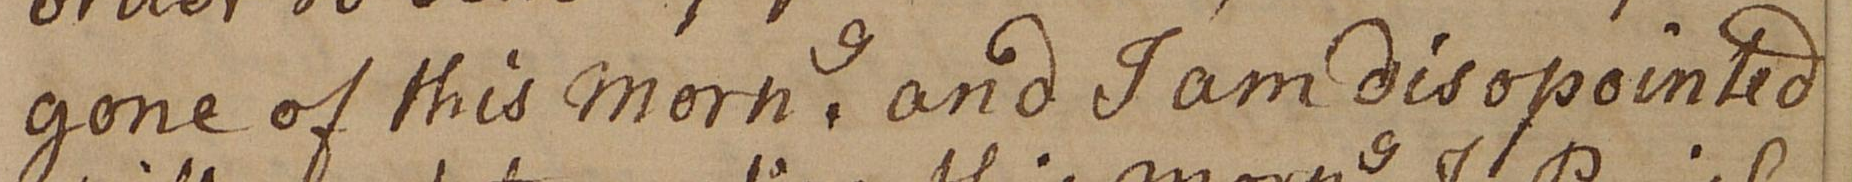gone of this morn^g, and I am disopointed
